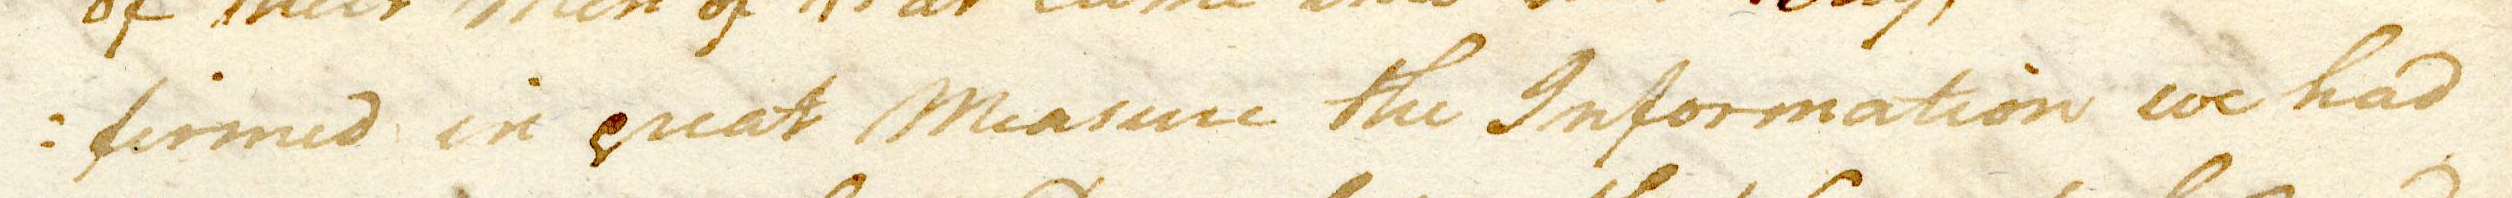-firmed in great measure the Information we had
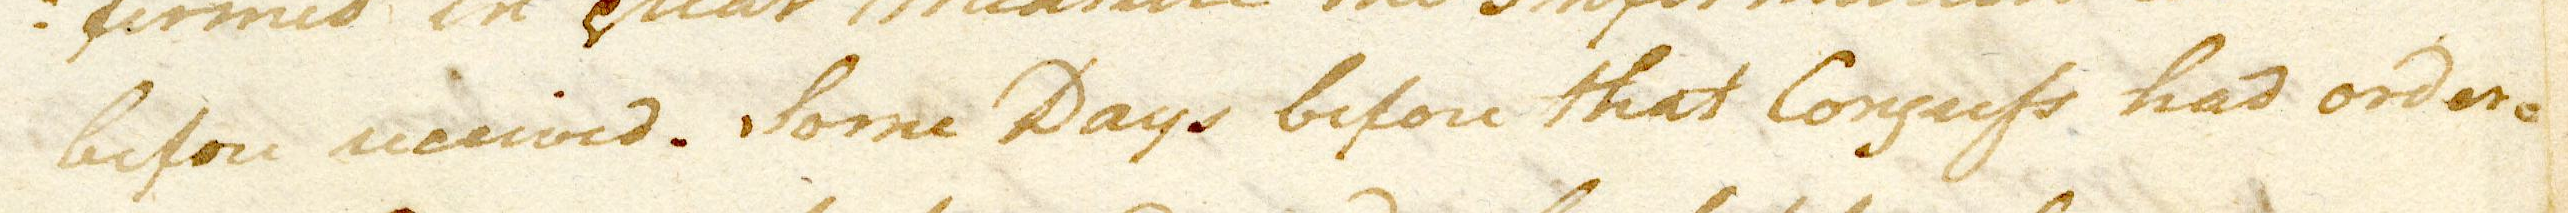before received. Some Days before that Congress had order-
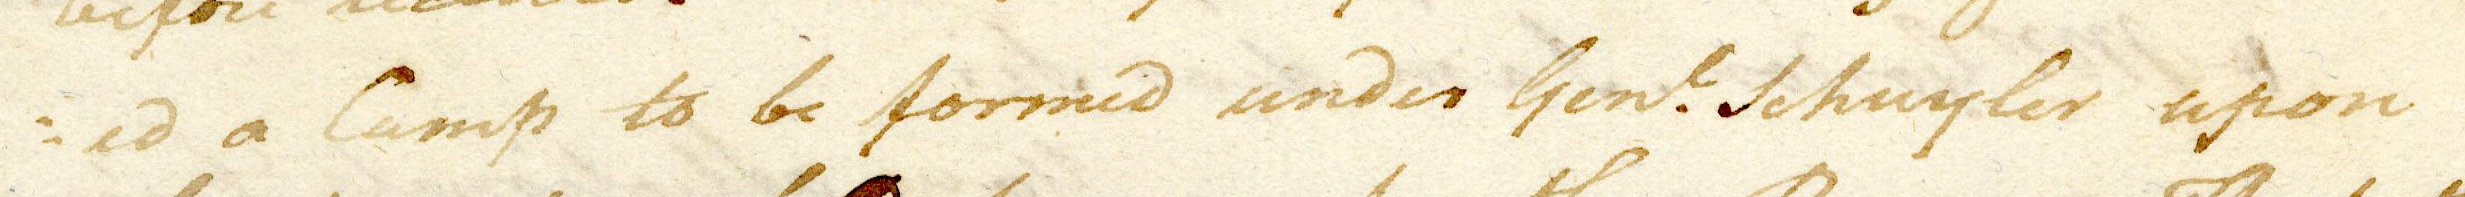-ed a Camp to be formed under Gen^l. Schuyler upon
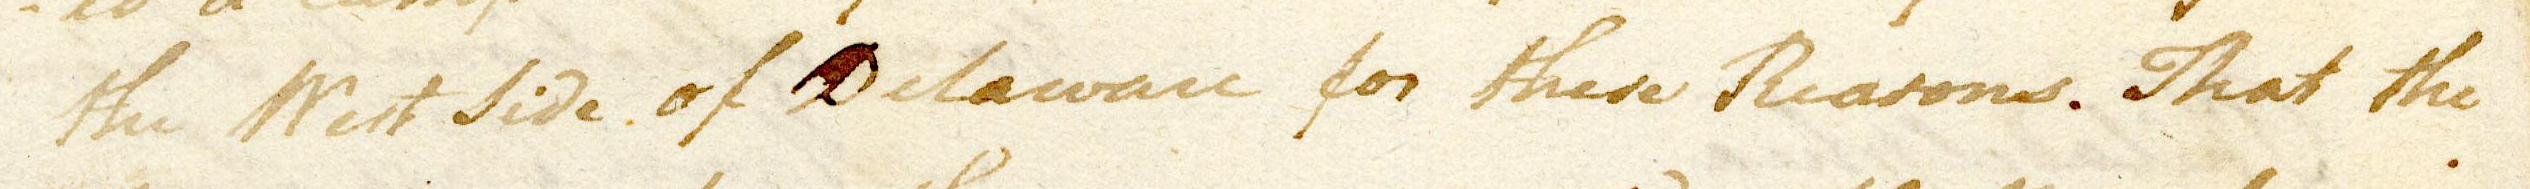the West Side of the Delaware for these Reasons. That the
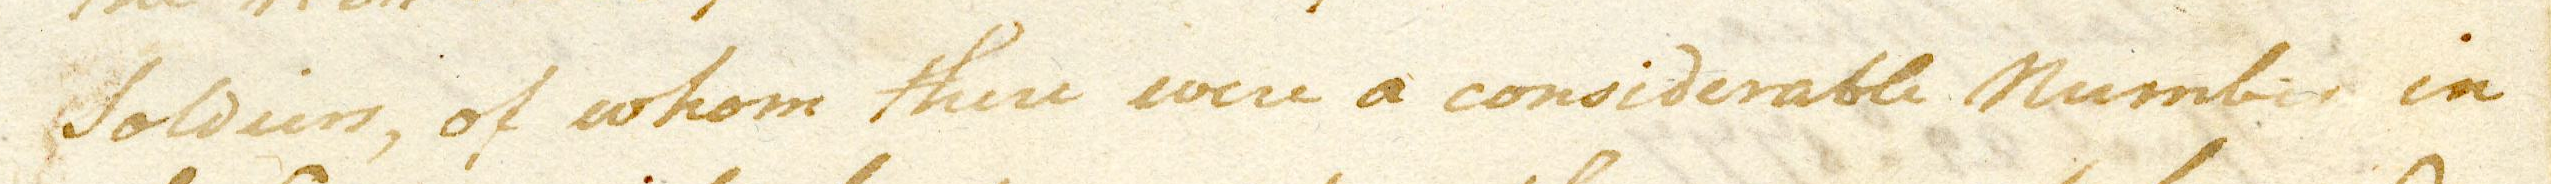Soldiers, of whom there were a considerable number in
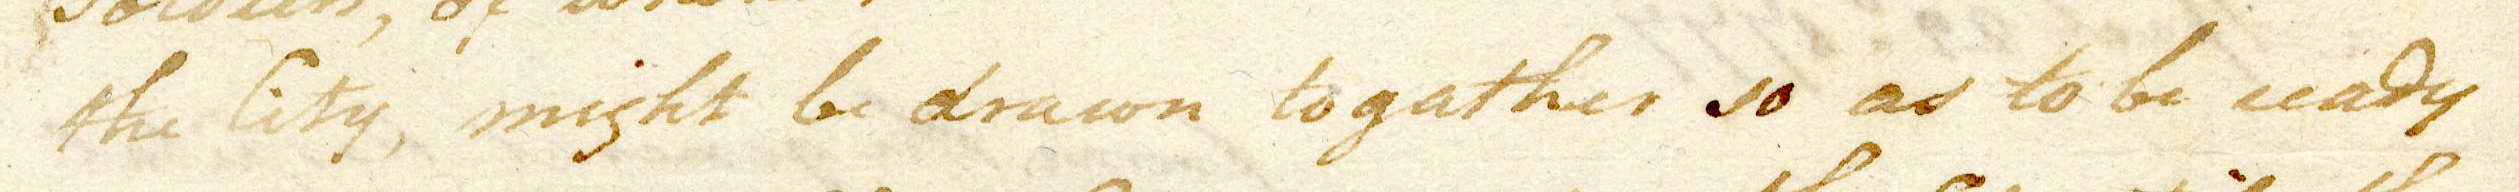the City, might be drawn togather so as to be ready
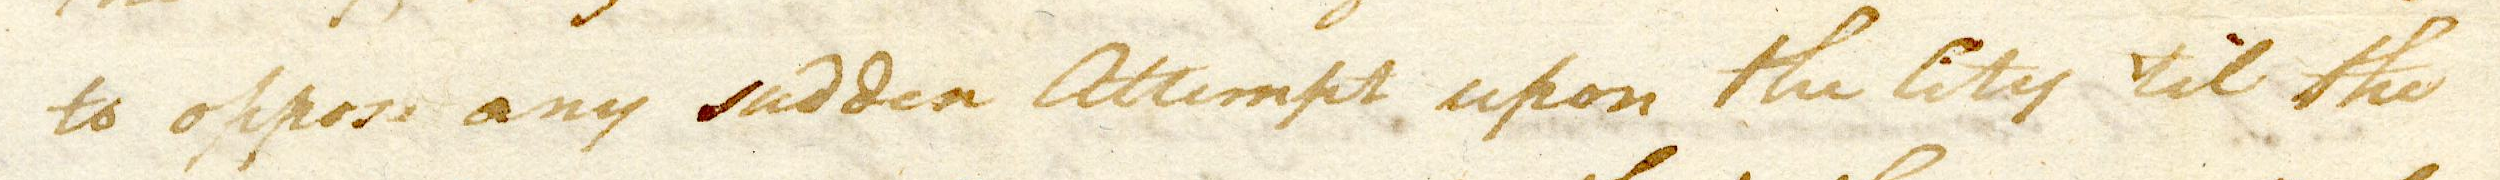to oppose any sudden Attempt upon the City til the
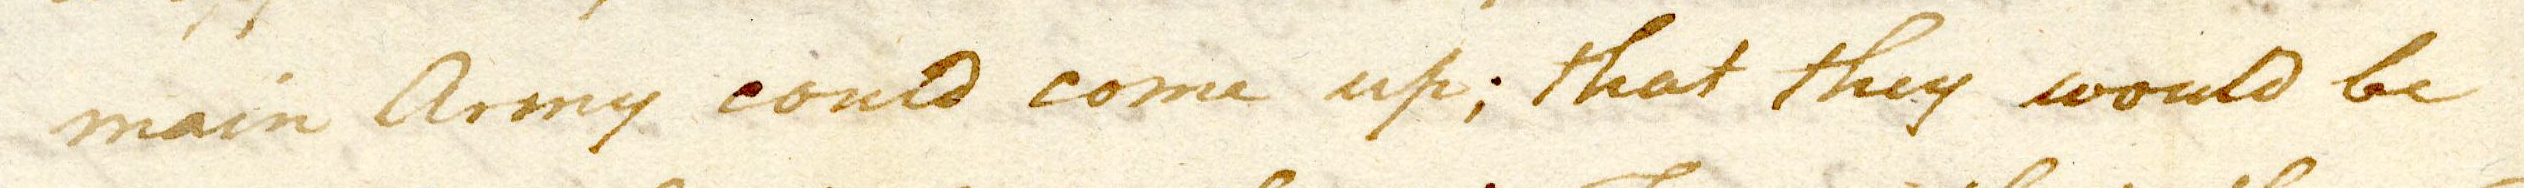main Army could come up; that they would be
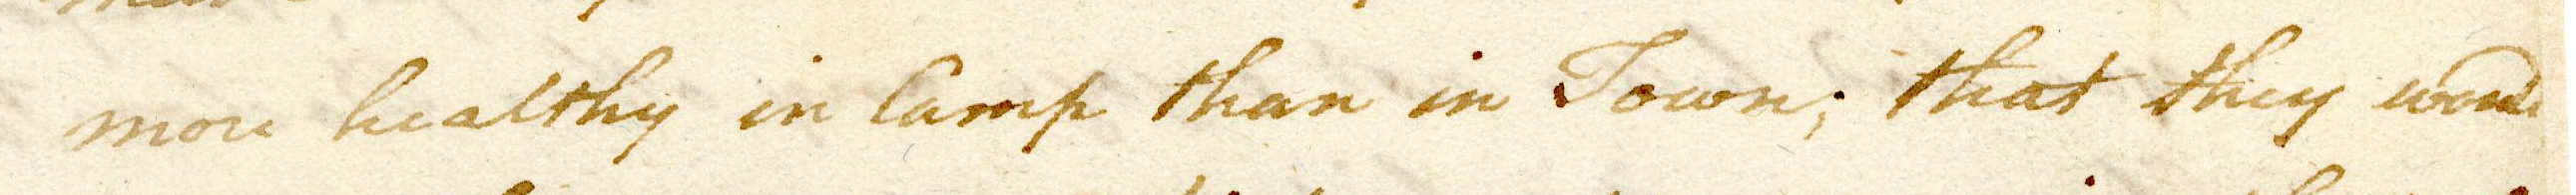more healthy in Camp than in Town; that they would
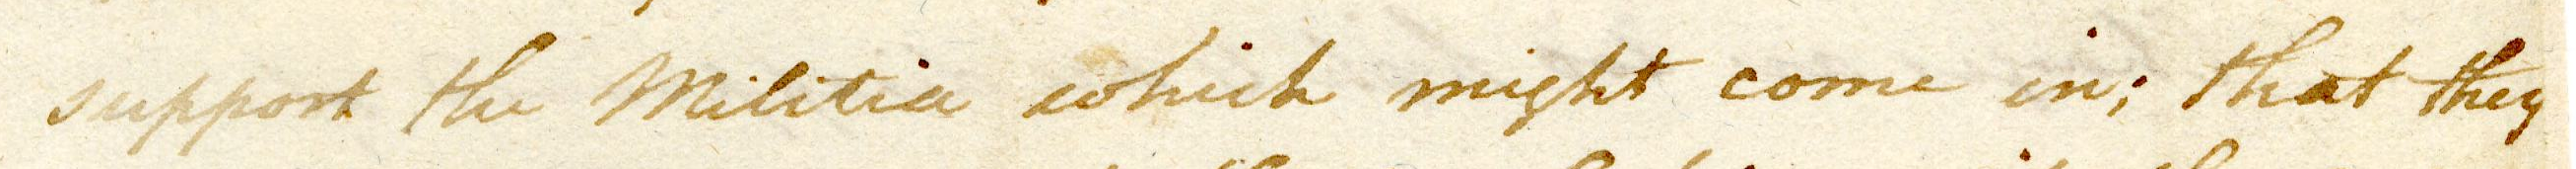support the Militia which might come in; that they
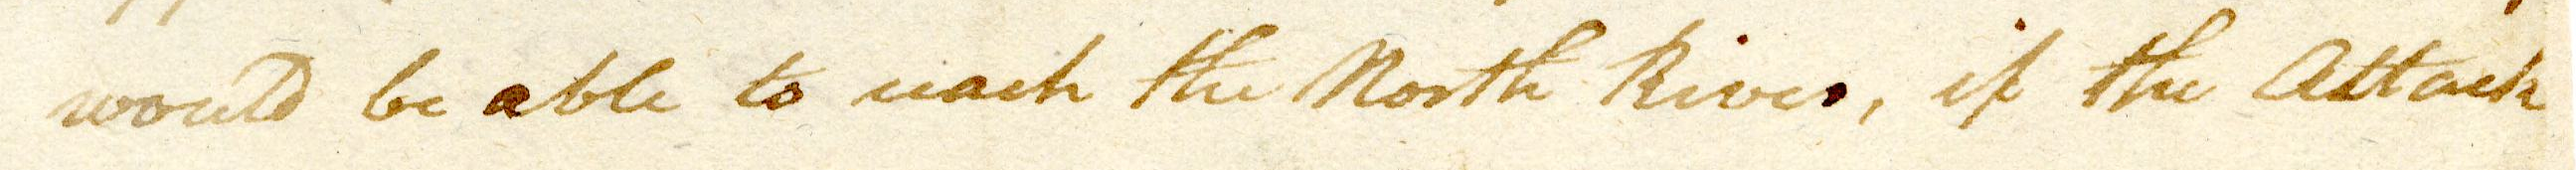would be able to reach the North River, if the Attack
